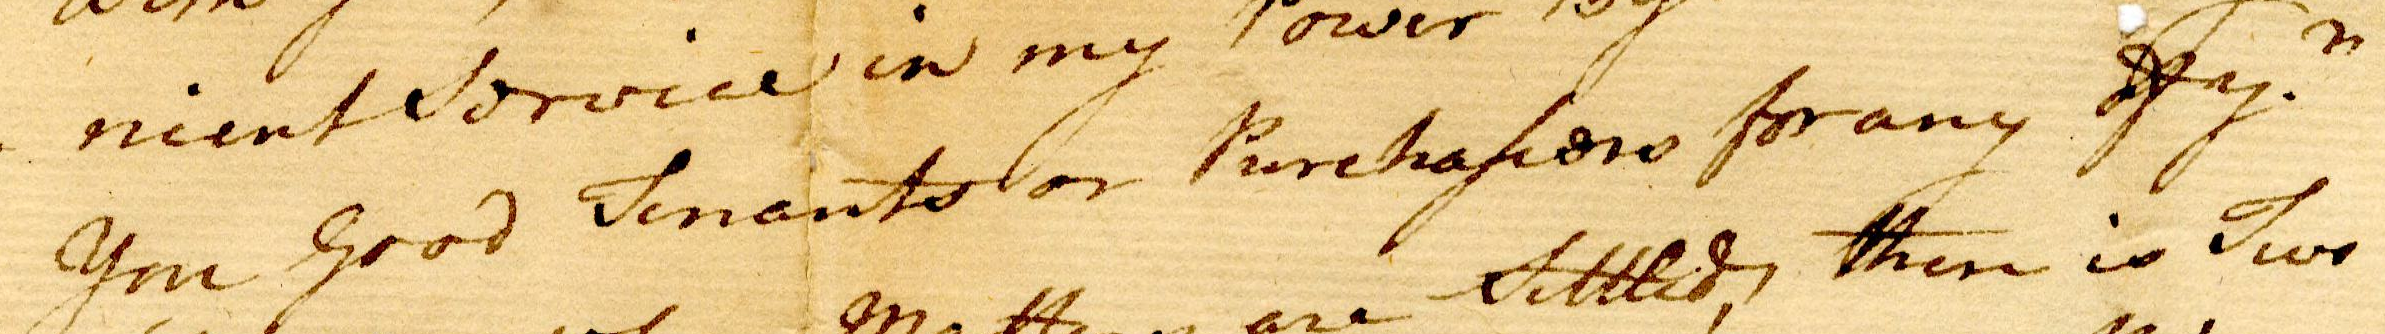You good Tenants for Purchasers for any of y^r.
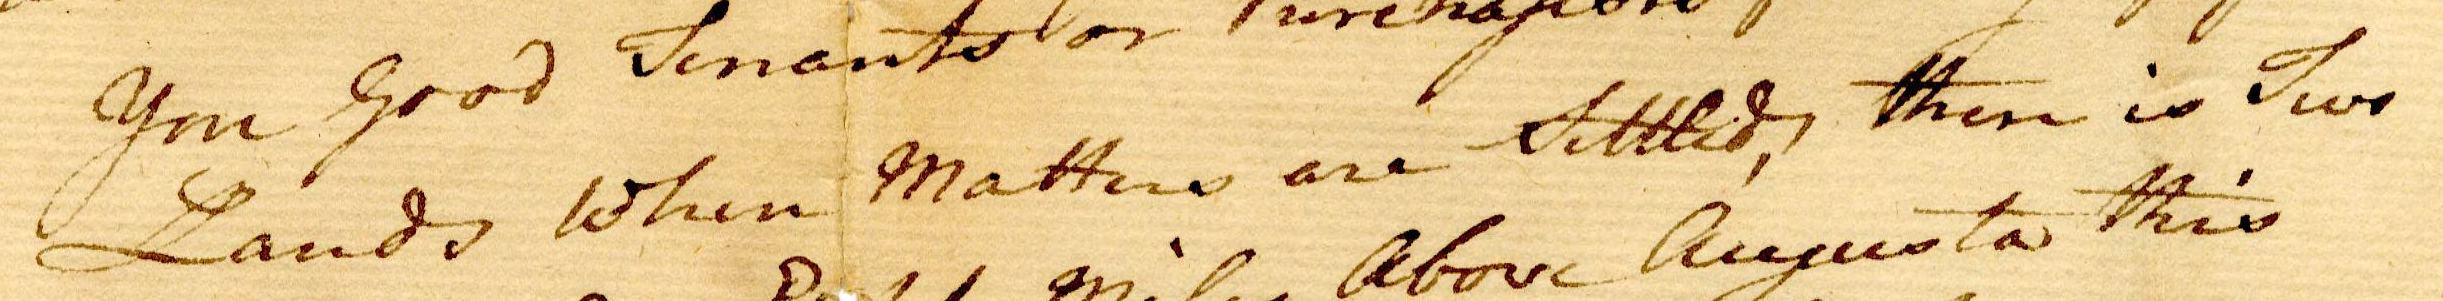Lands when Matters are settled, then is Two
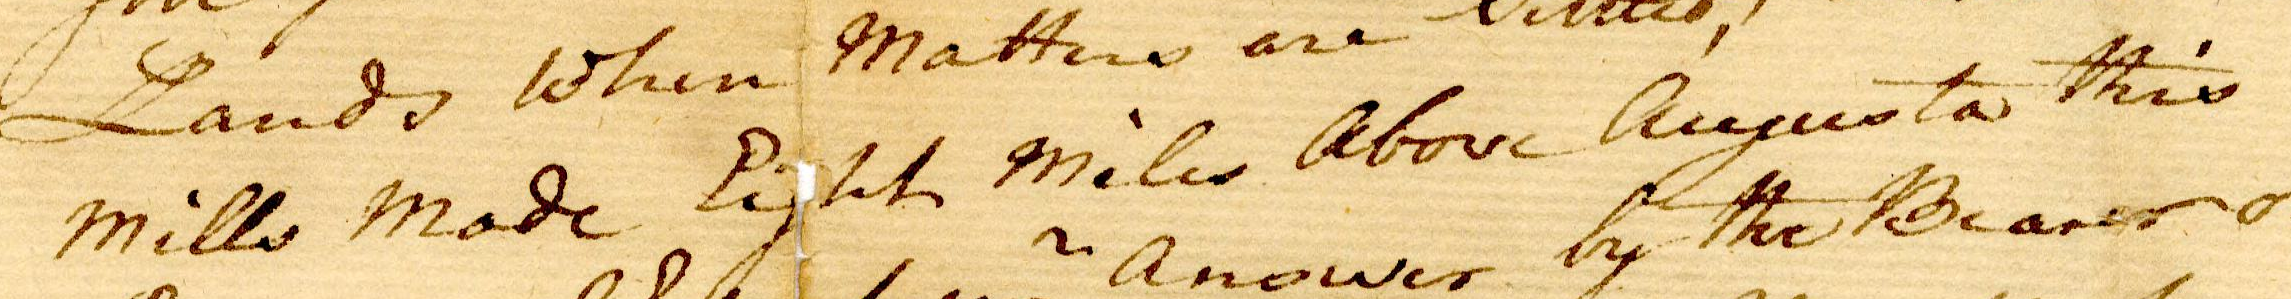mills made Eight Miles above Augusta this
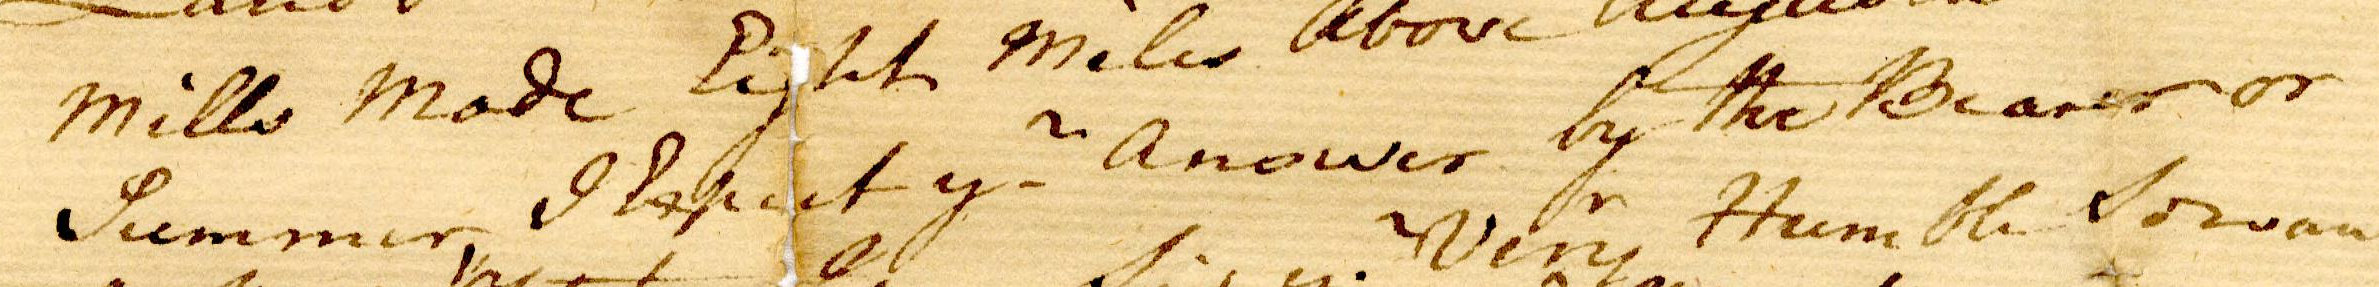Summer, I Expect y^r. Answer by the Bearer or
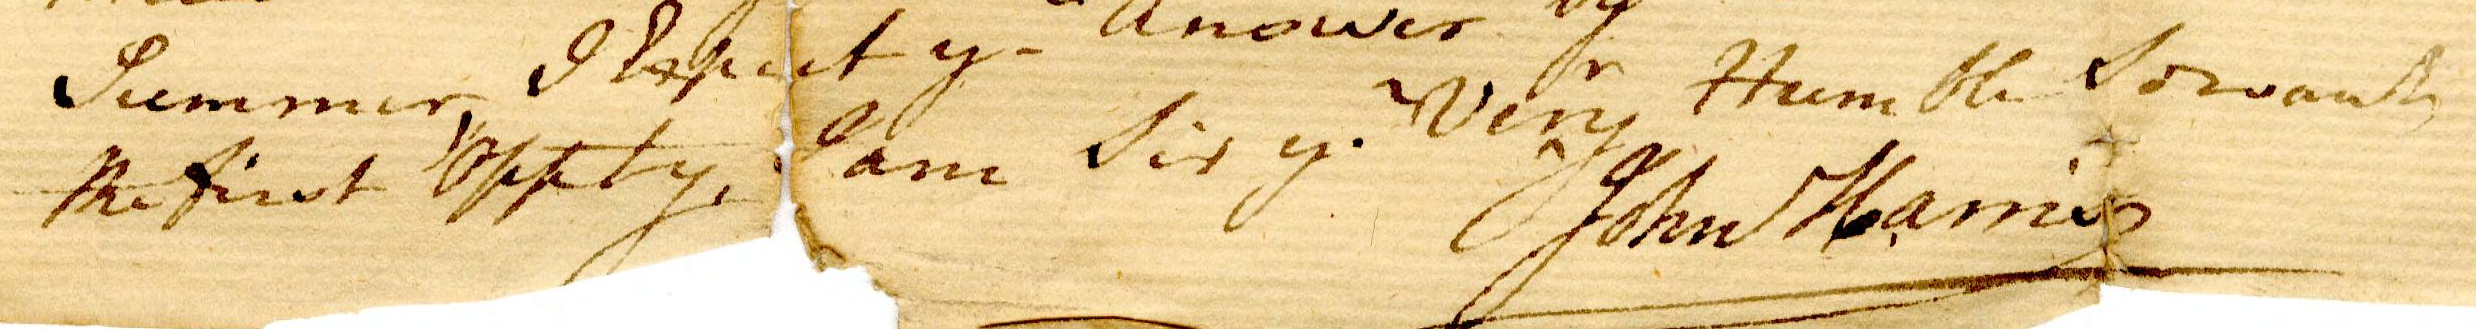the first Oppty, I am Sir y^r. Ver^ry Humble Servant,
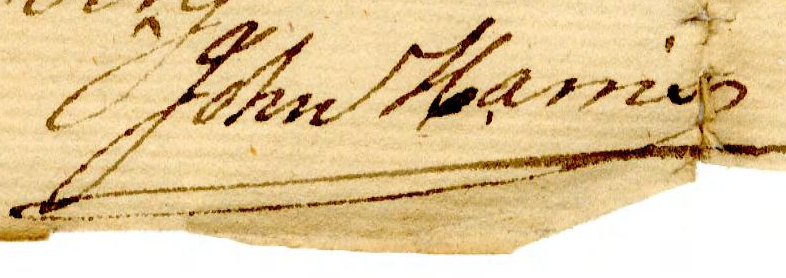John Harris
